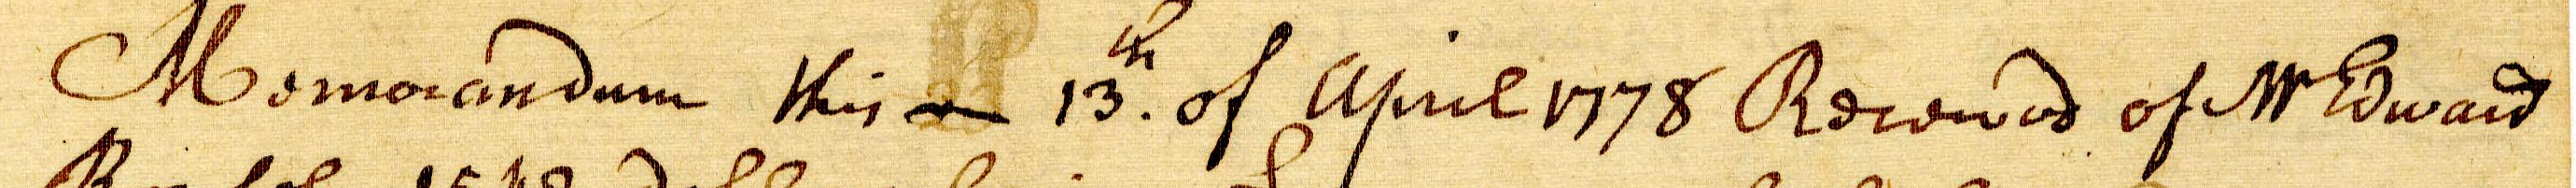Memorandum this [23^d] 13^th. of April 1778 Received of M^r Edward
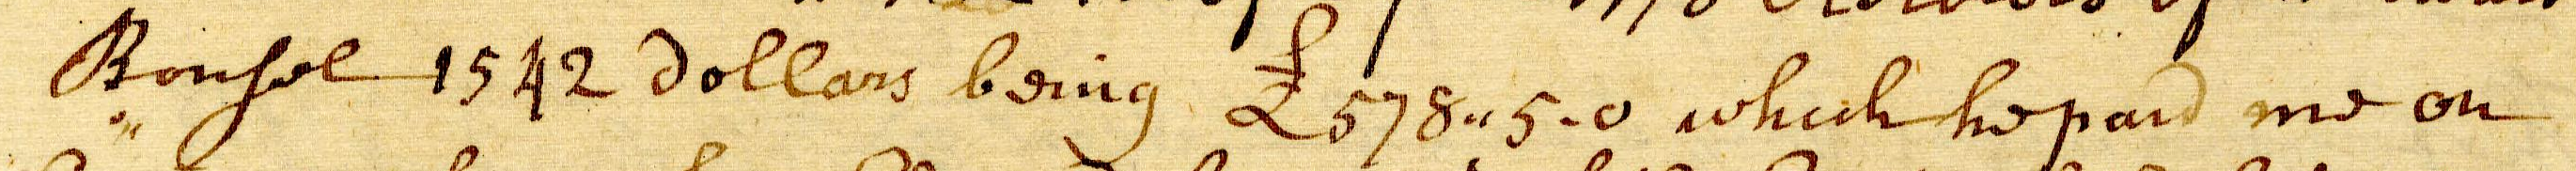Rougel 1542 dollars being £578,,5,0 which he paid me on
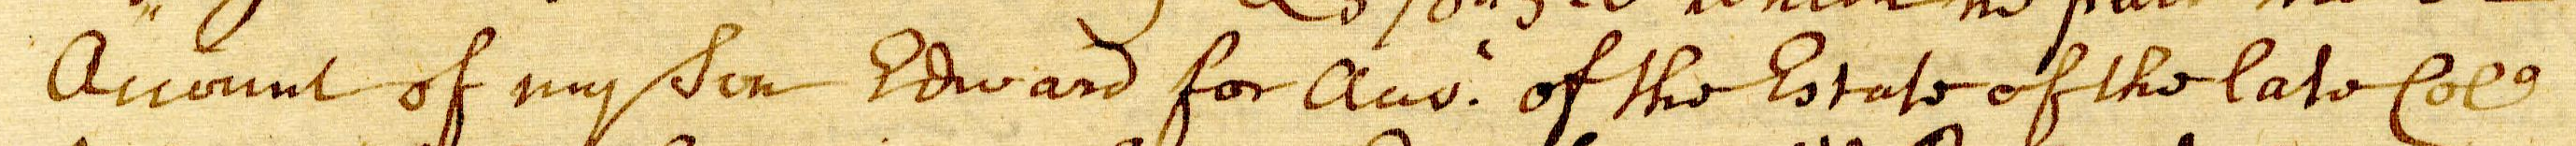Account of my Son Edward for Acco^t. of the Estate of the late Col^o
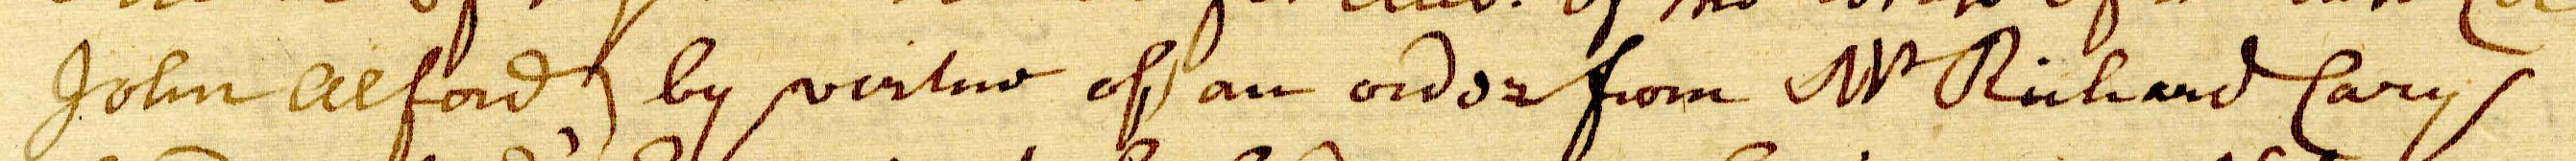John Alford by virtue of an order from M^r Richard Cary
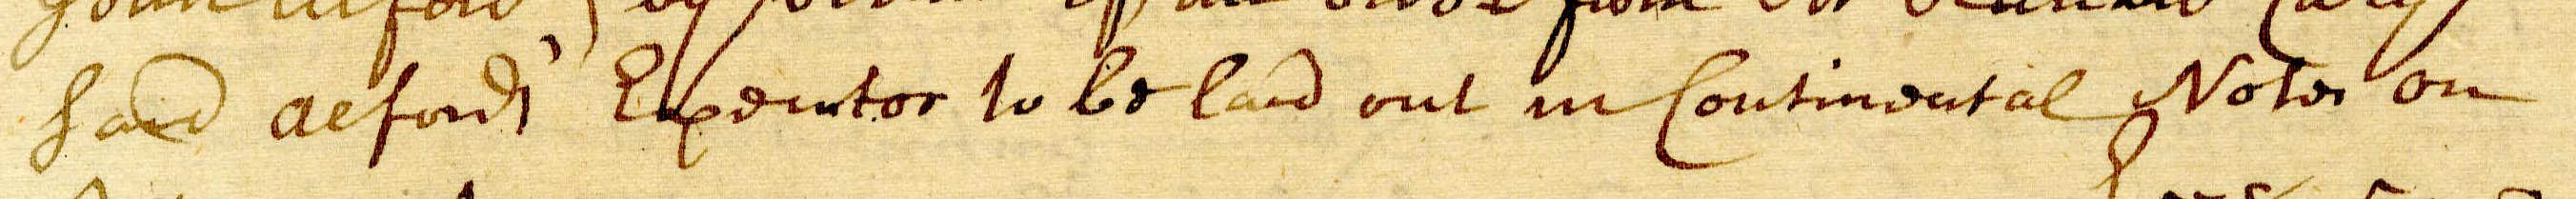Land Alfords' Executor to be laid out in Continental Notes on
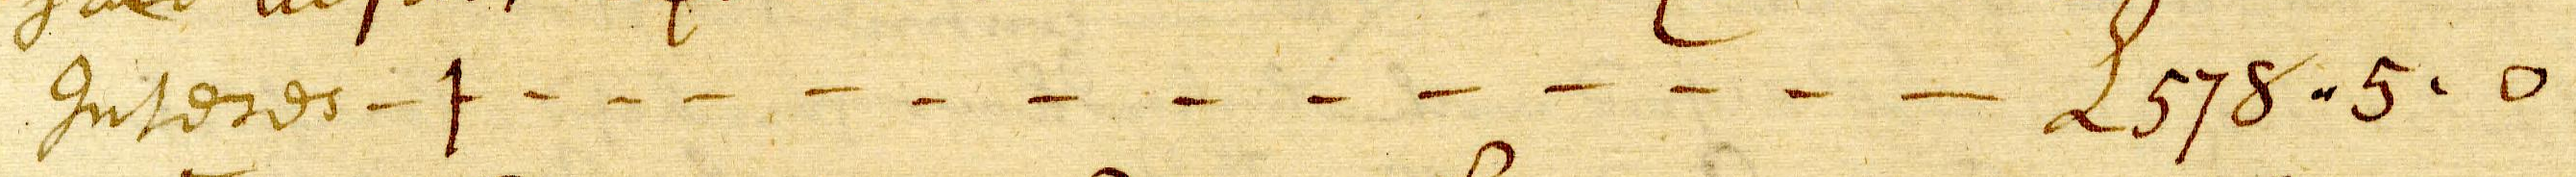Intres-t------------- £578..5.0
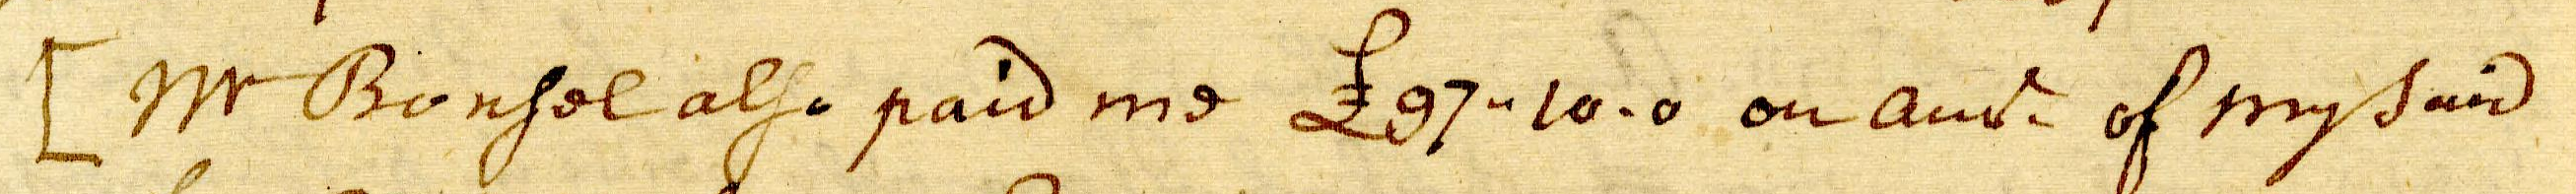(M^r Bonsel also paid me £97..10.0 on Acc^t. of my said
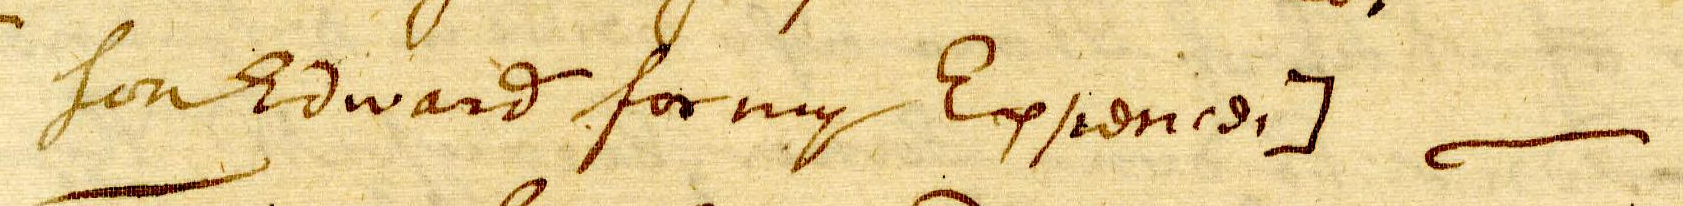son Edward for my Expence.)-
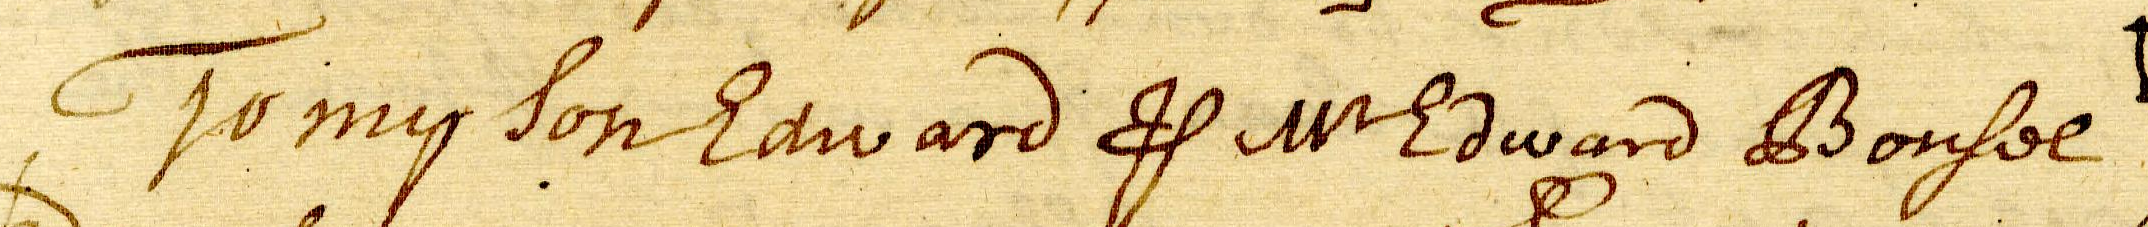To my Son Edward per M^r Edward Bonsel
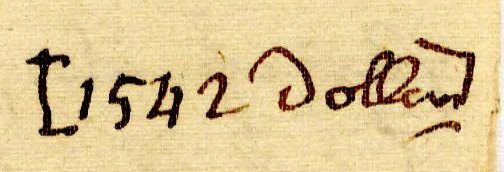(1542 dollars)
